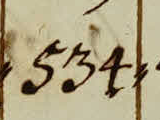534
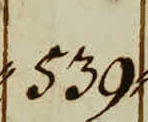539
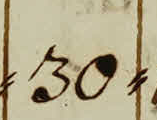30
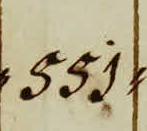551
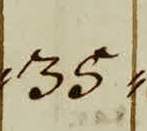35
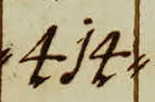414
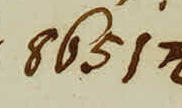8651
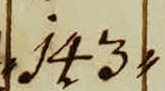143
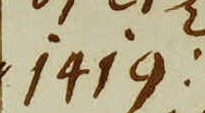1419
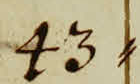43
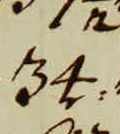34
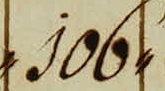106
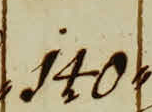140
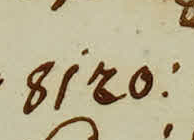8120.
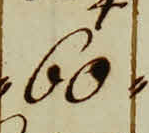60
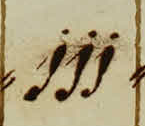111
